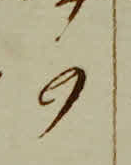9
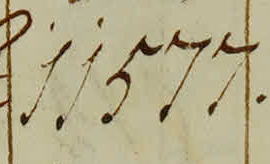11577
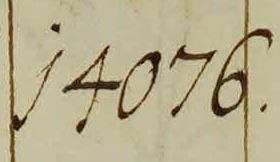14076
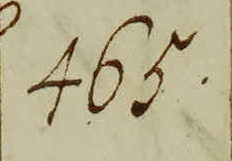465
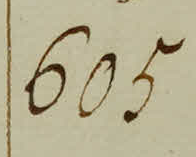605
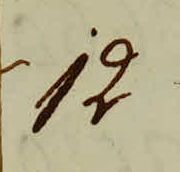12
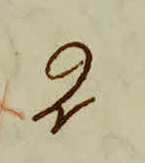2
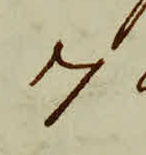7
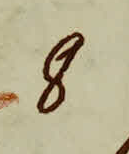8
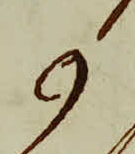9
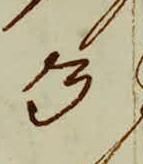3
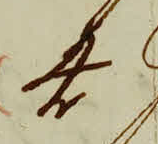4
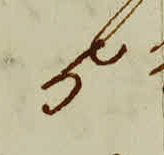5
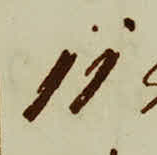11
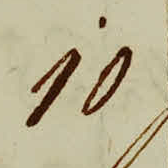10
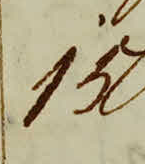15
